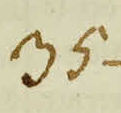35
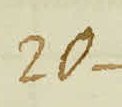20
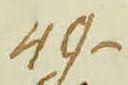49
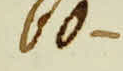60
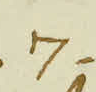7
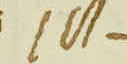18
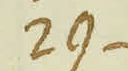29
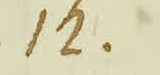12.
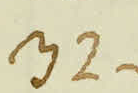32
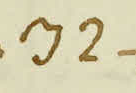32
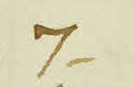7 -
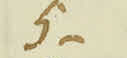5 -
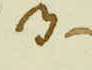3 -
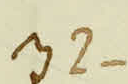32
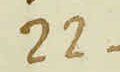22
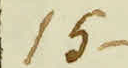15
